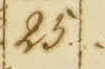25.
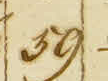59
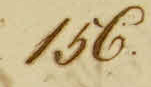156.
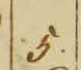5.
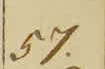57.
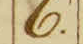6.
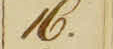16.
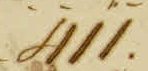411.
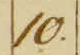10.
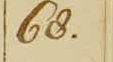68.
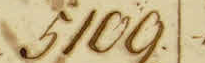5109.
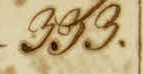333.
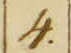4.
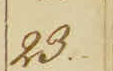23.
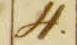4.
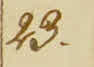23.
